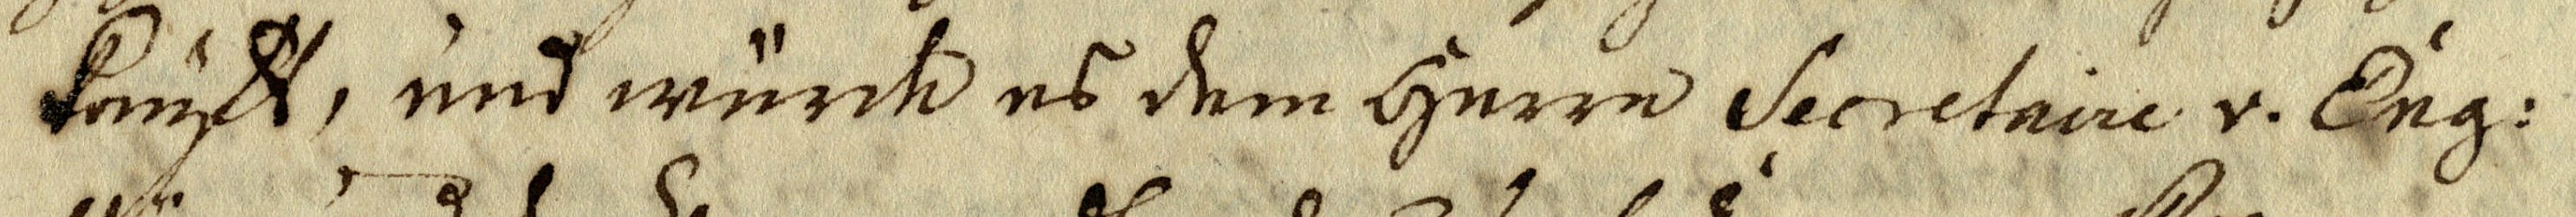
kauft, und würde es dem Herrn Secretaire v. Eng¬
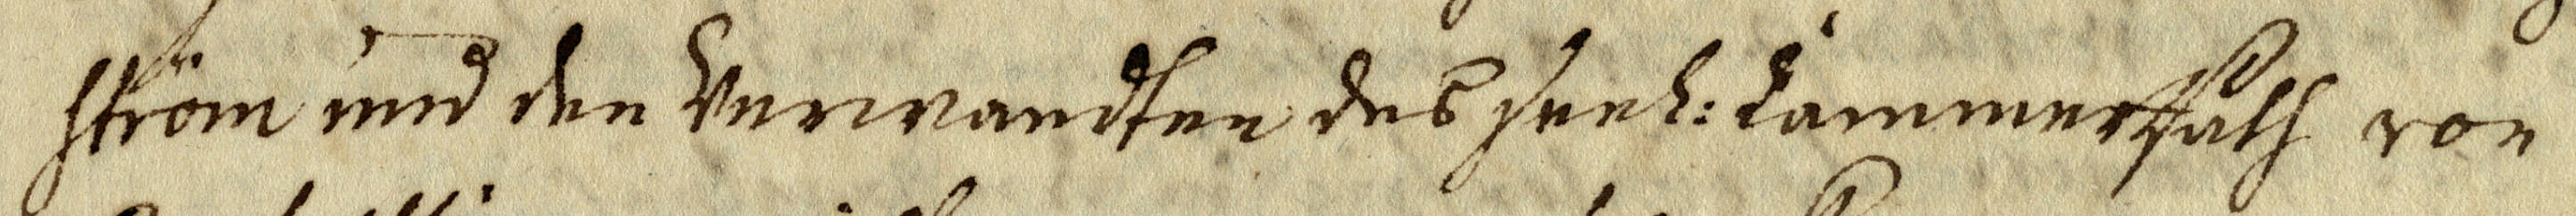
srtöm und den Verwandten des seel. CammerRath von
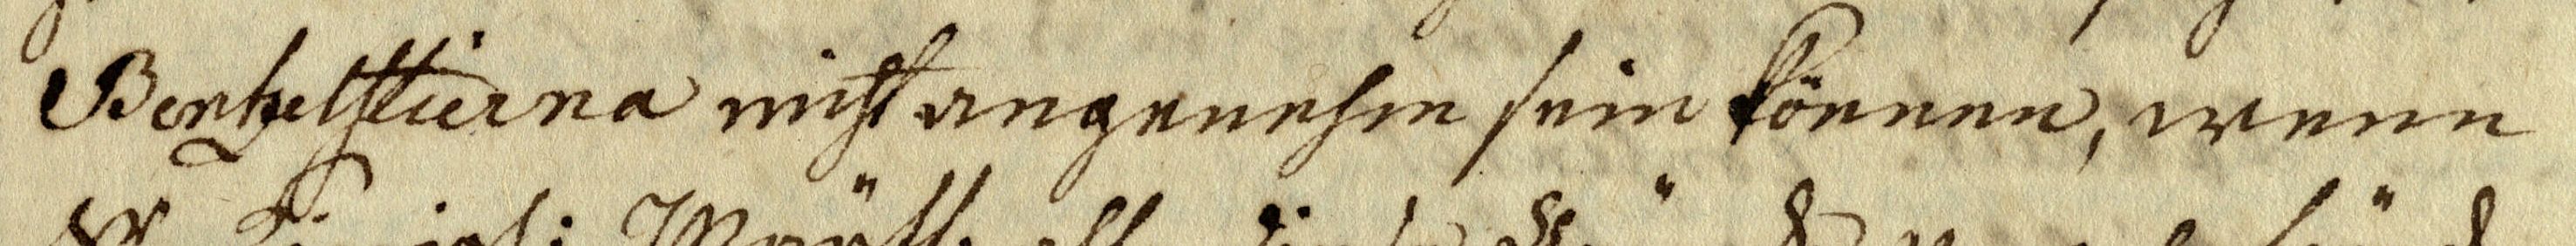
Bentzelstierna nicht angenehm sein können, wenn
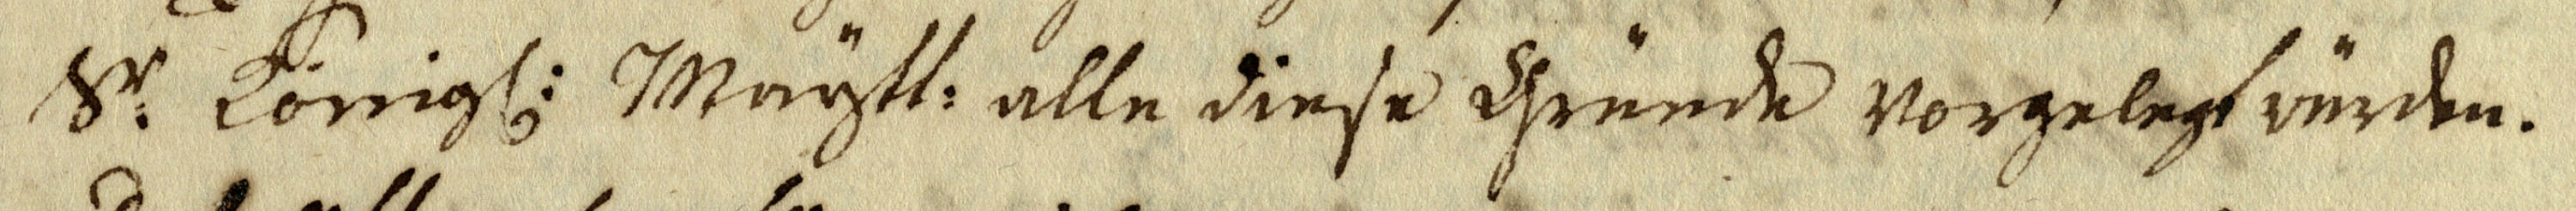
Sr. Königl. Maÿtt. alle diese Gründe vorgelegt würden.
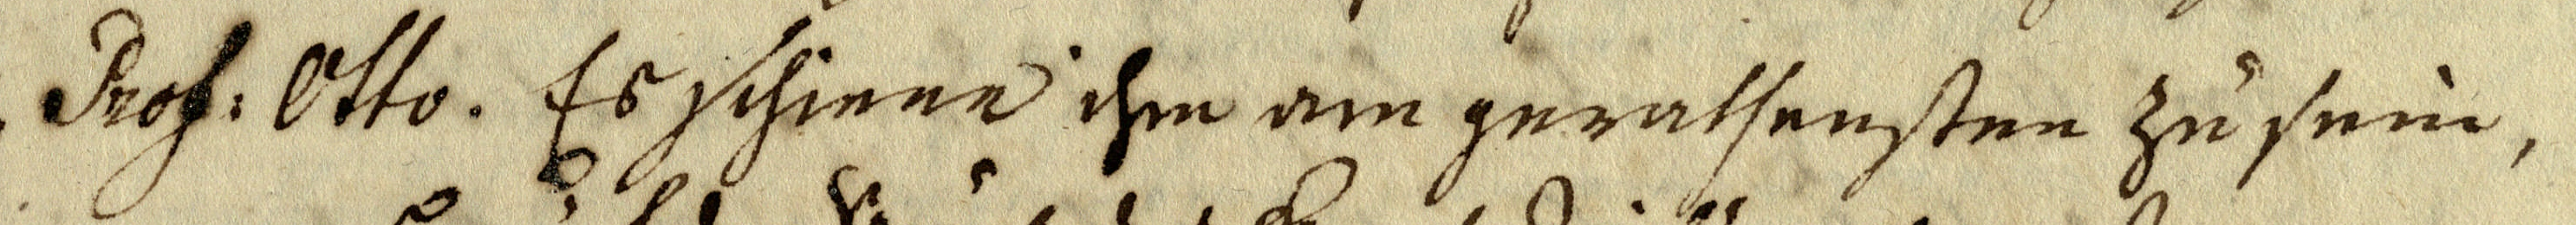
dh Prof. Otto. Es schiene ihm am gerathensten zu sein,
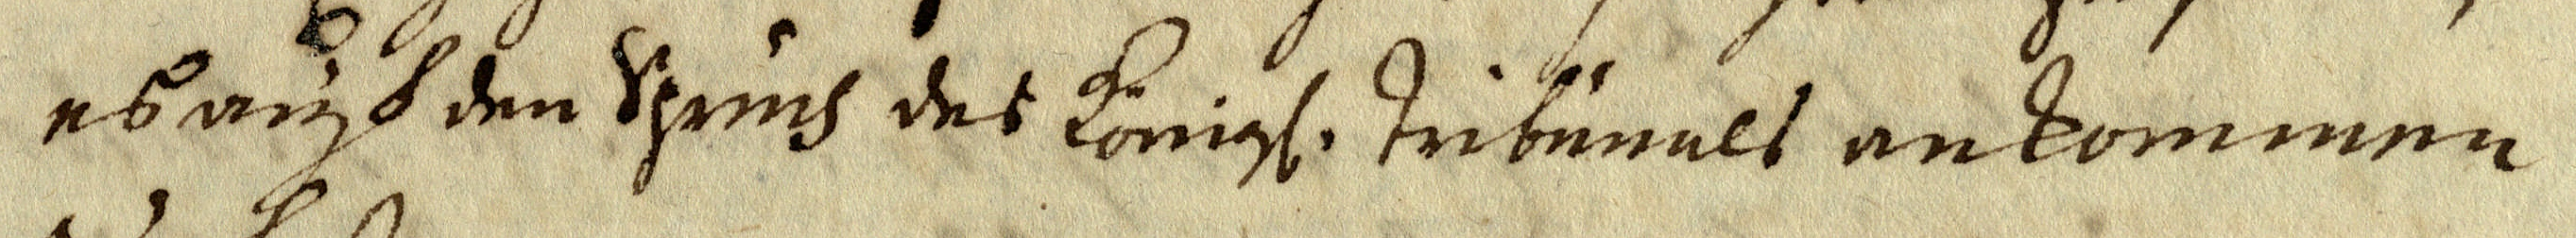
es auf den Spruch de Königl. Tribunals ankommen
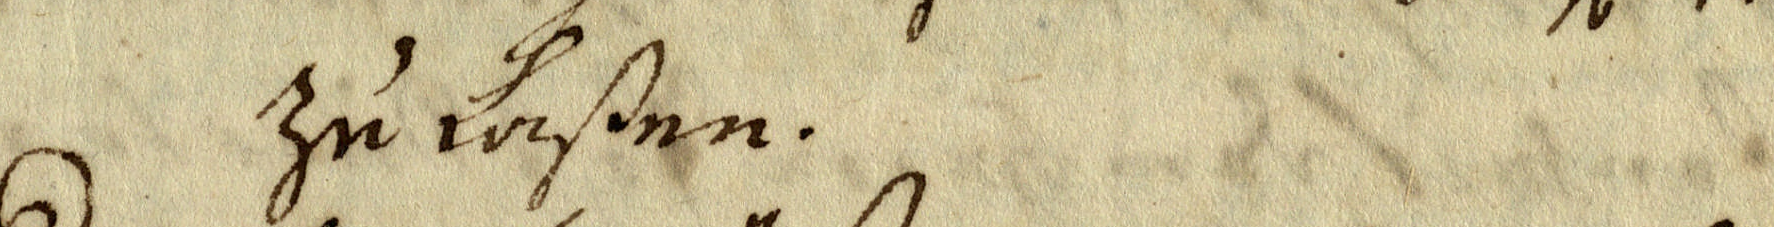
zu laßen.
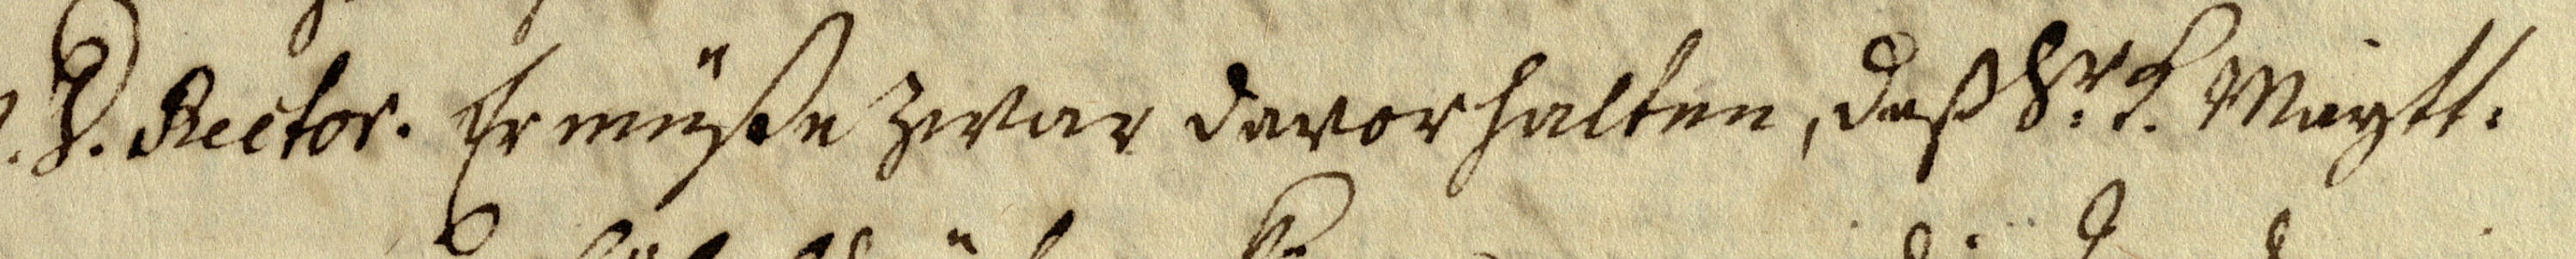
M. D. Rector. Er müße zwardavor halten, daß Sr.K. Maÿtt.
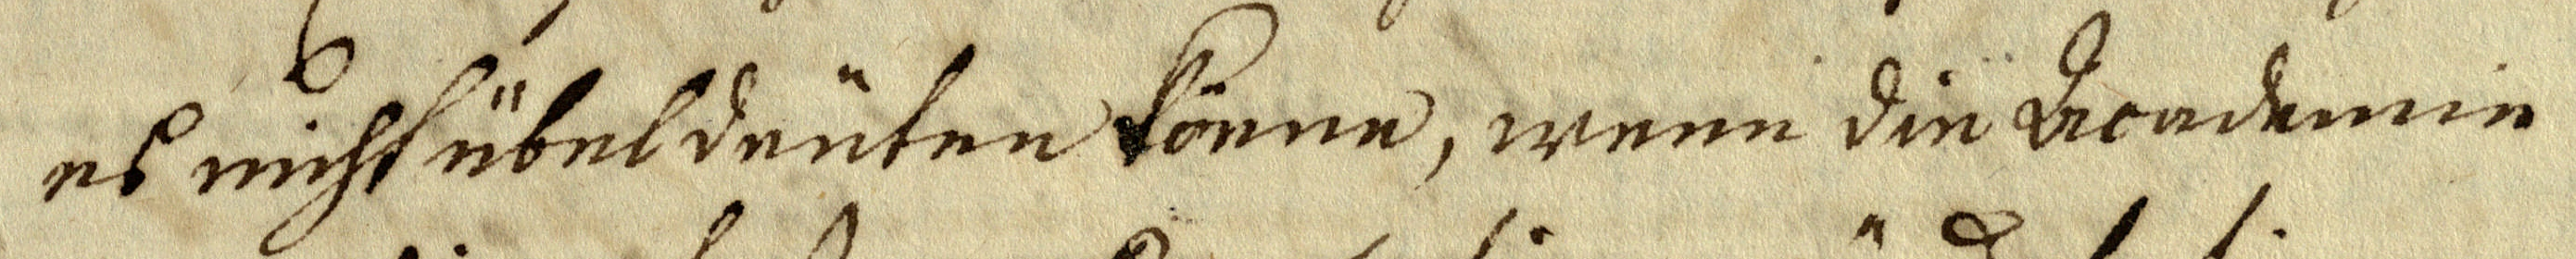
es nicht übel deuten könne, wenn die Academie
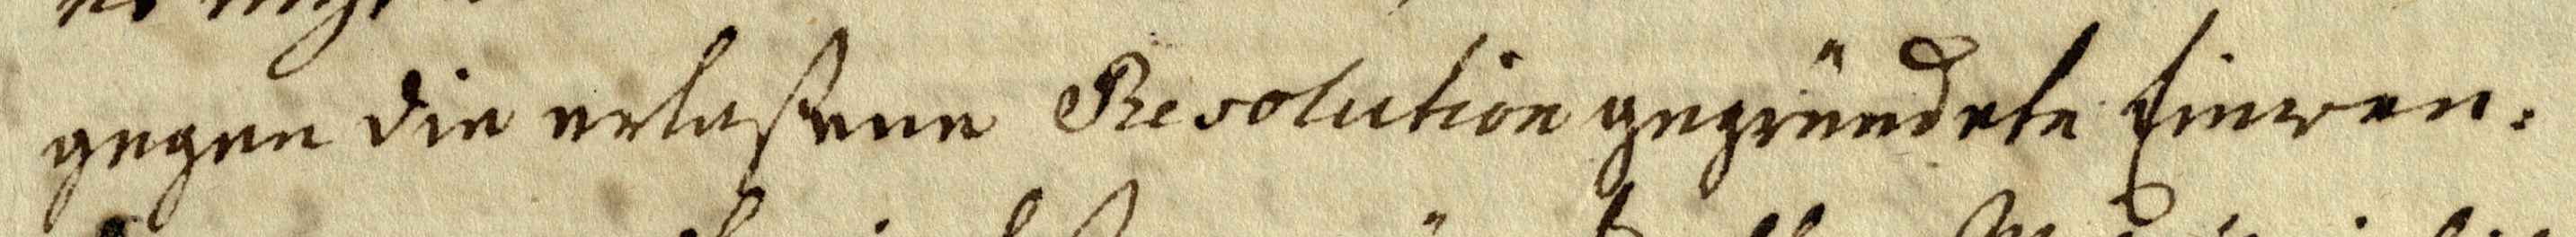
gegen die erlaßene Resolution gegründete Einwen¬
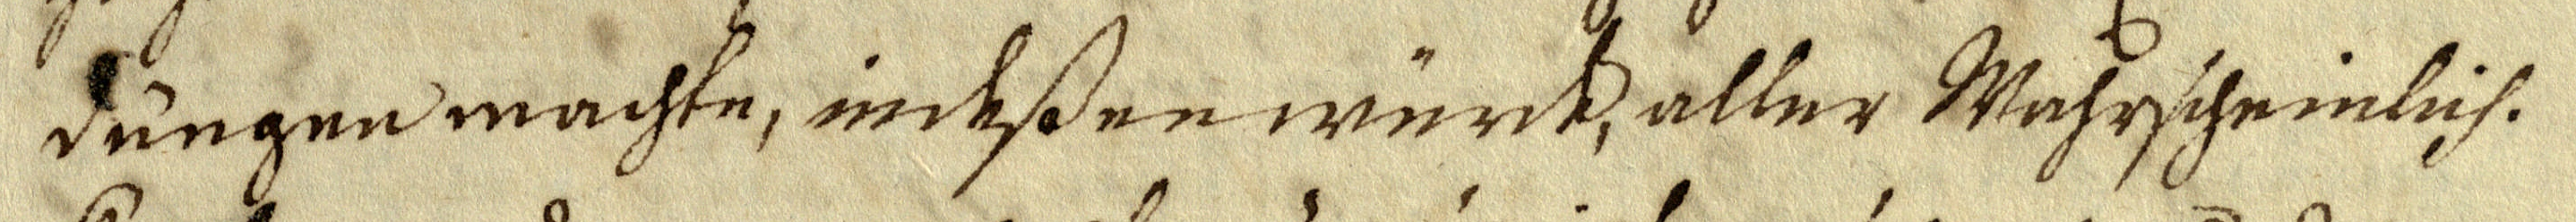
dungen machte, indeßen würde aller Wahrscheinlich¬
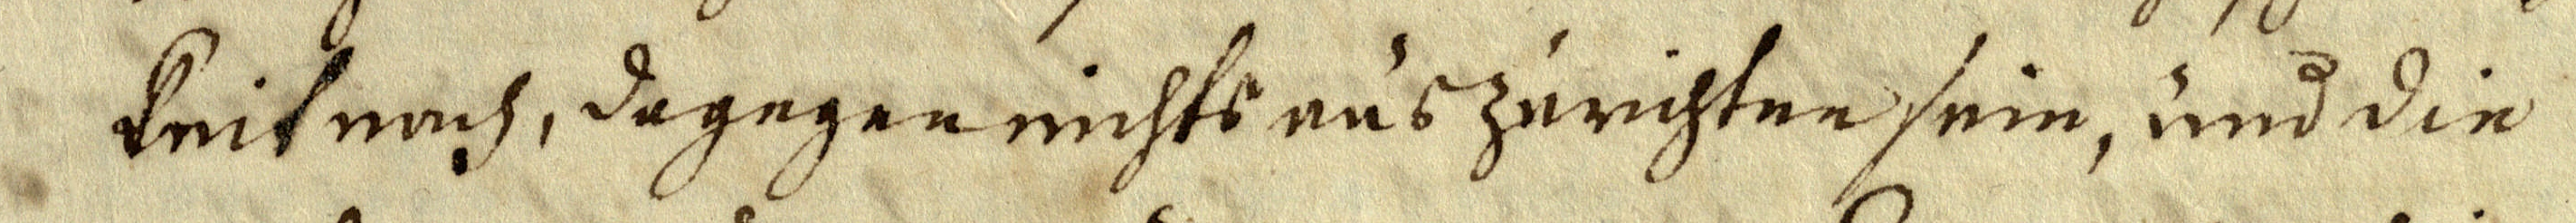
keit nach, dagegen nichts auszurichtensein, und die
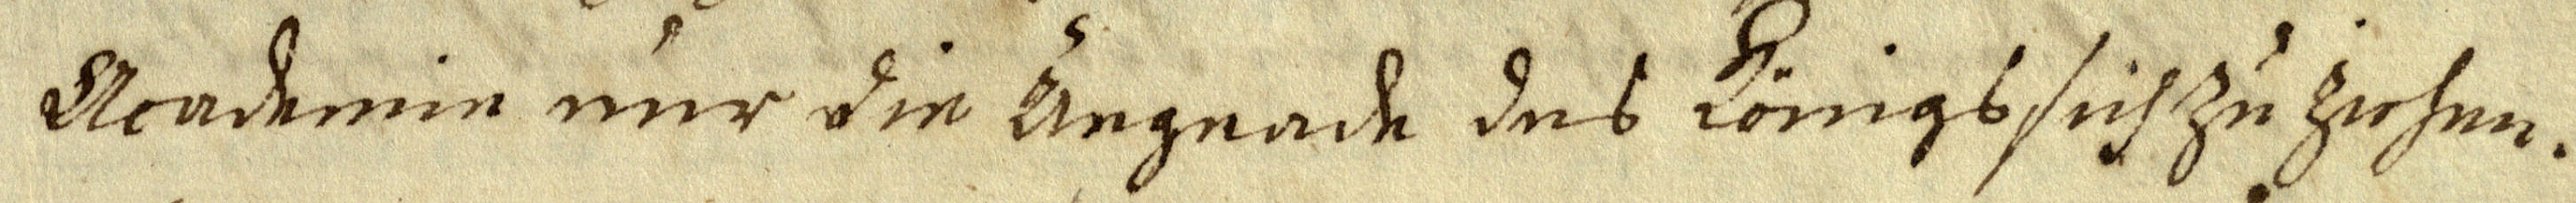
Academie nur die Ungnade des Königs sich zuziehen.
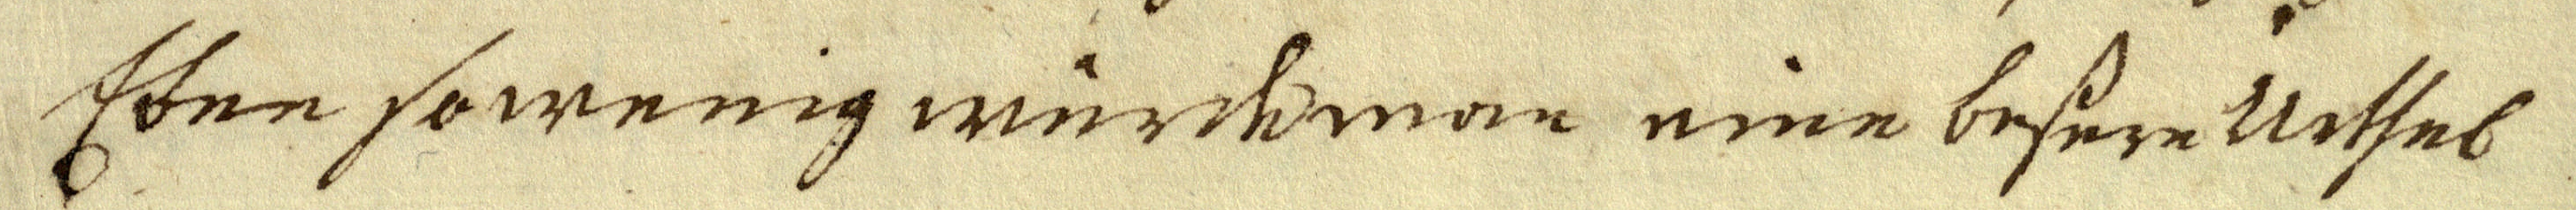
Eben sowenig würde man eine beßere Urthel
